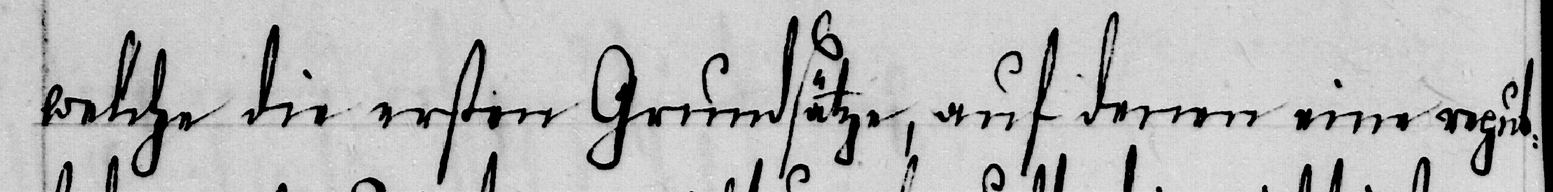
welche die ersten Grundsätze, auf denen eine repu¬
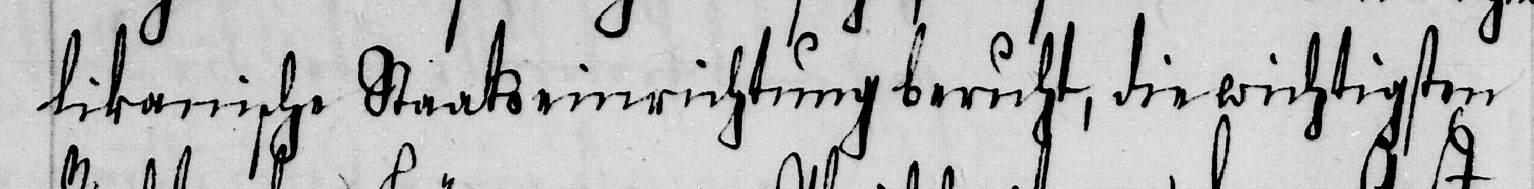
blikanische Staatseinrichtung beruht, die wichtigsten
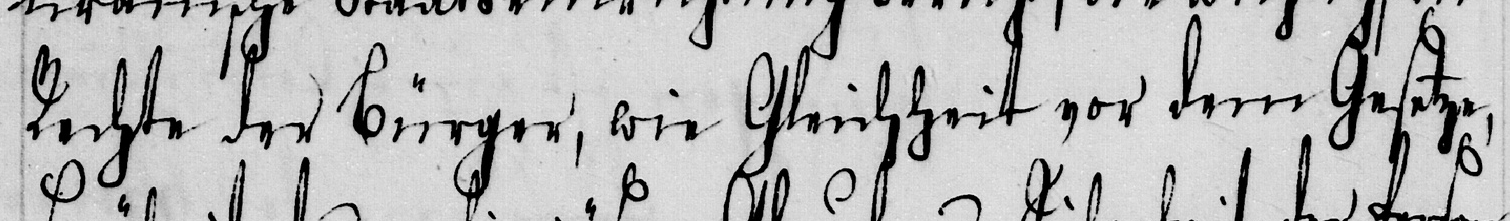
Rechte der Bürger, wie Gleichheit vor dem Gesetze,
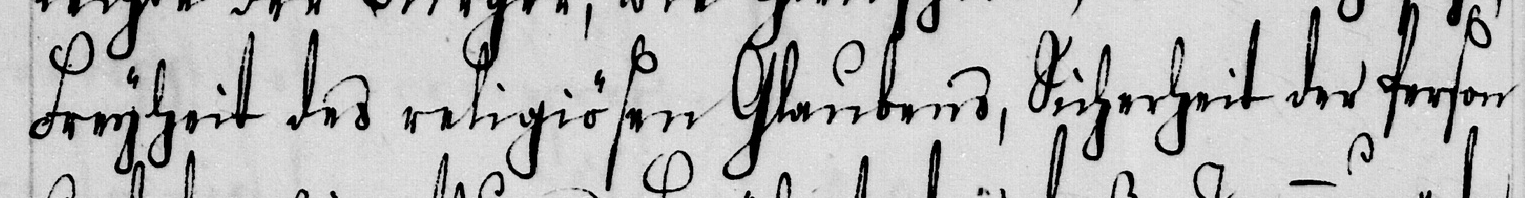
Freyheit des religiösen Glaubens, Sicherheit der Person
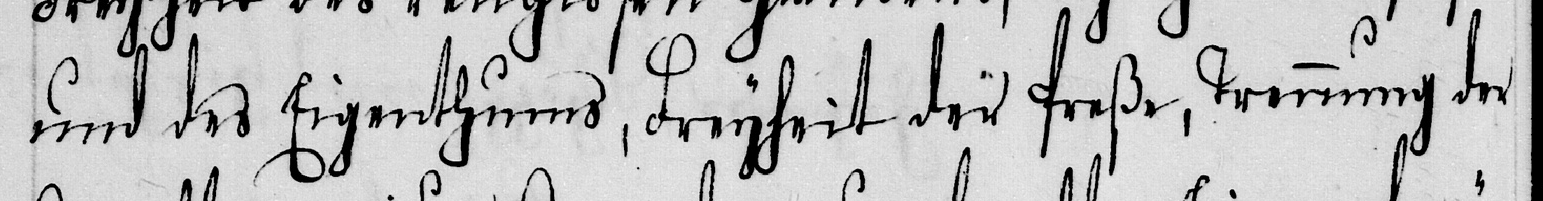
und des Eigenthums, Freyheit der Preße, Trennung der
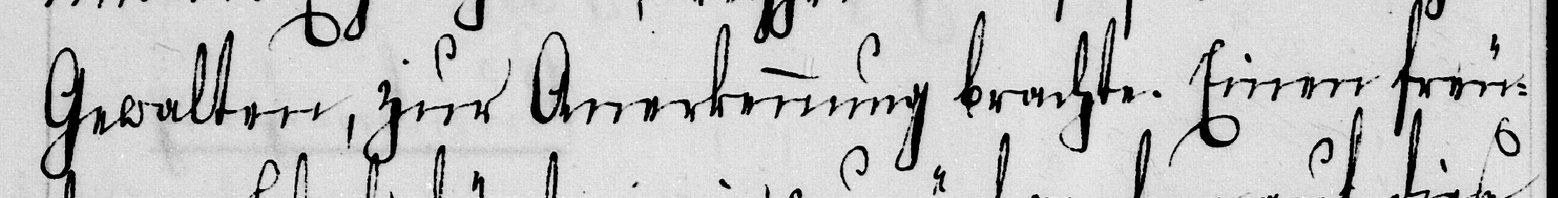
Gewalten, zur Anerkennung brachte. Einen freu¬
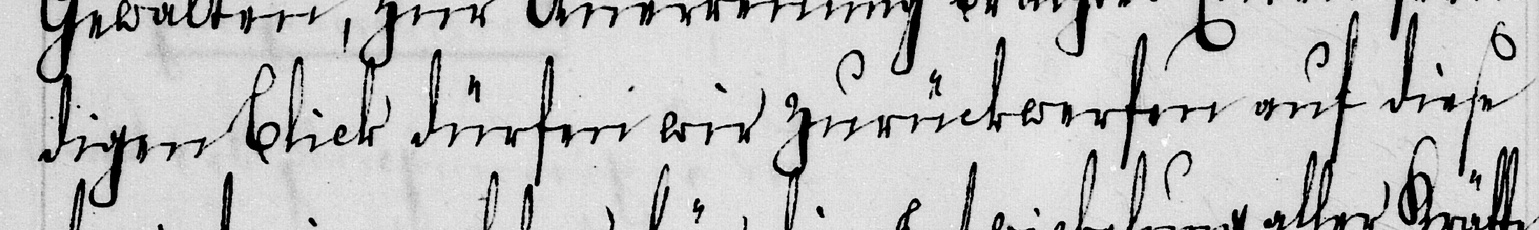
digen Blick dürfen wir zurückwerfen auf diese
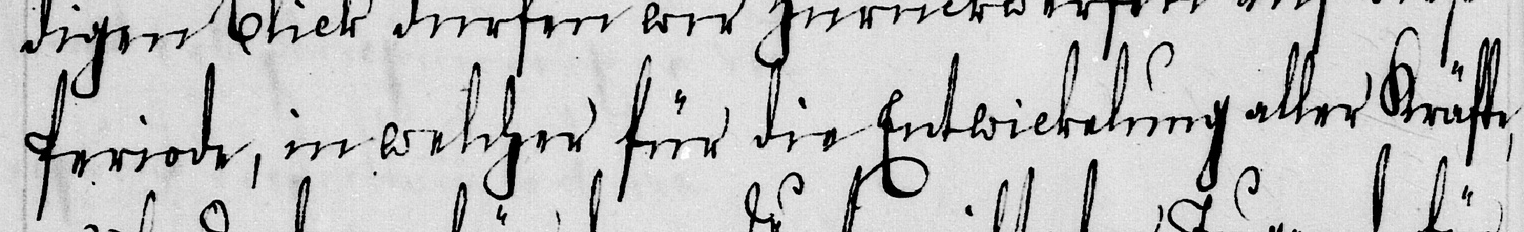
Periode, in welcher für die Entwicklung aller Kräf¬
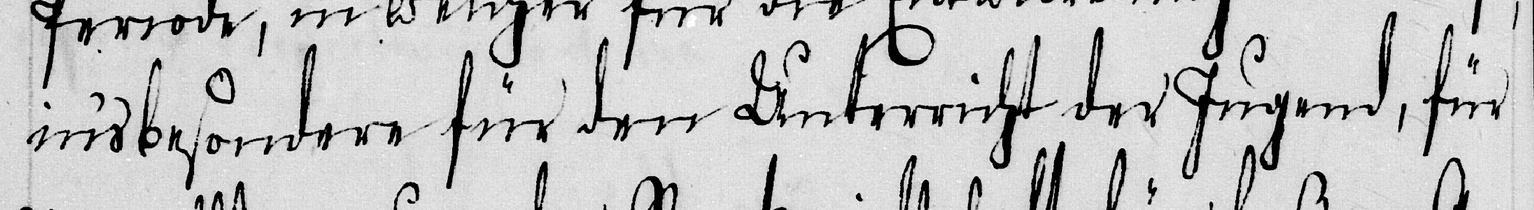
insbesondere für den Unterricht der Jugend, für
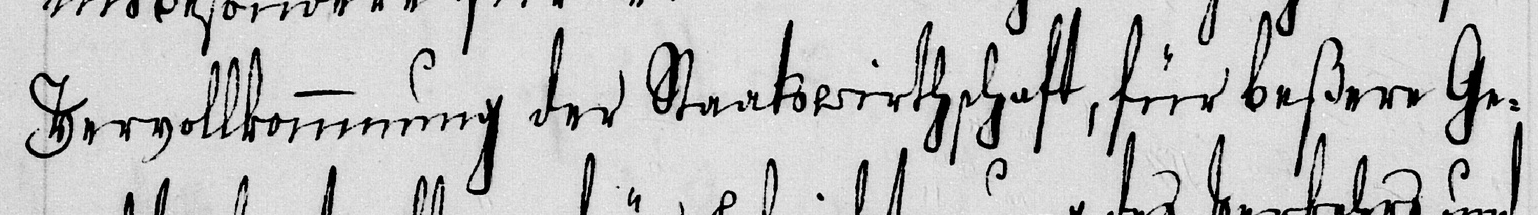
Vervollkommnung der Staatswirthschaft, für beßere Ge¬
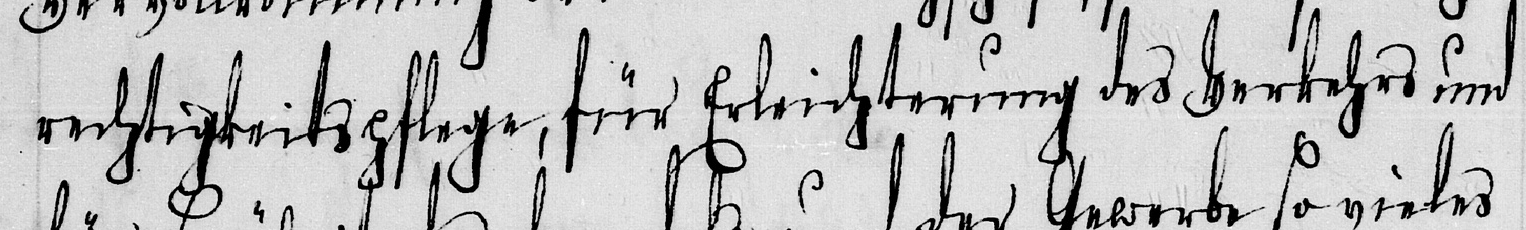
rechtigkeitspflege, für Erleichterung des Verkehrs und
